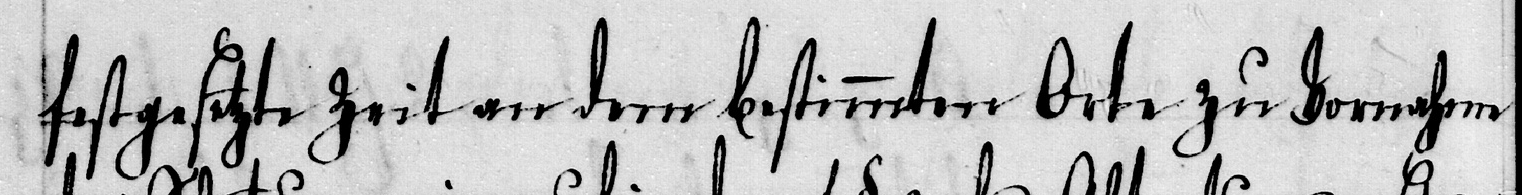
festgesetzte Zeit an dem bestimmten Orte zu Vornahme
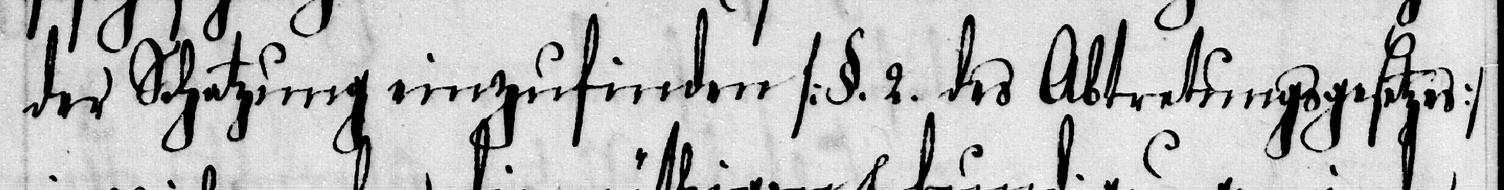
der Schatzung einzufinden [§. 2. des Abtretungsgesetzes]
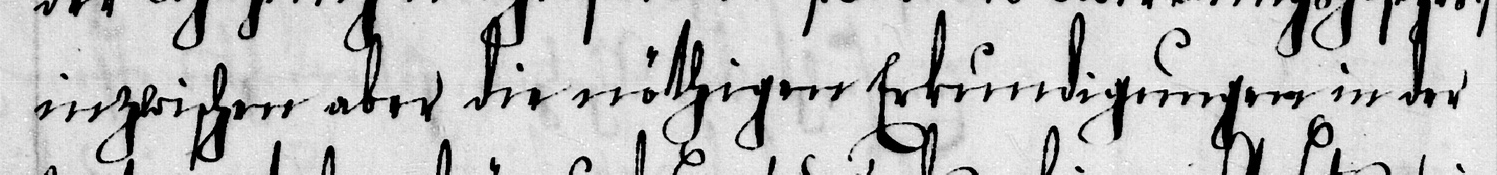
inzwischen aber die nöthigen Erkundigungen in der
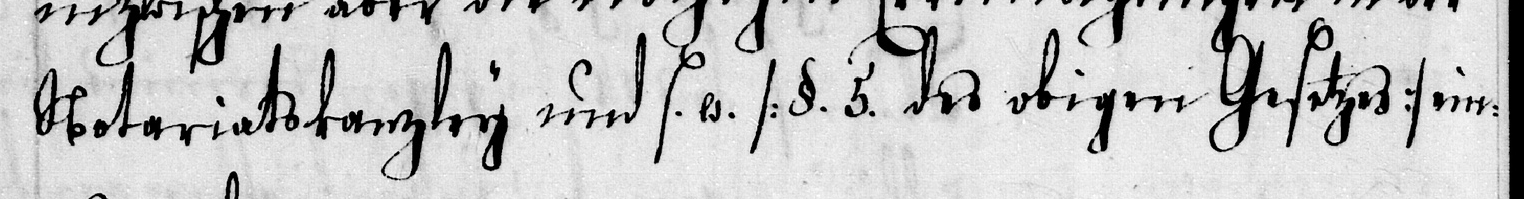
Notariatskanzley und s. w. [§. 5. des obigen Gesetzes] ein¬
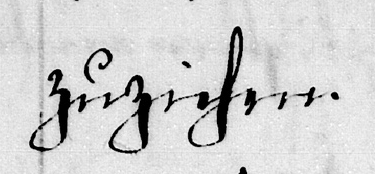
zuziehen.
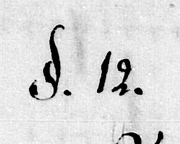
§. 12.
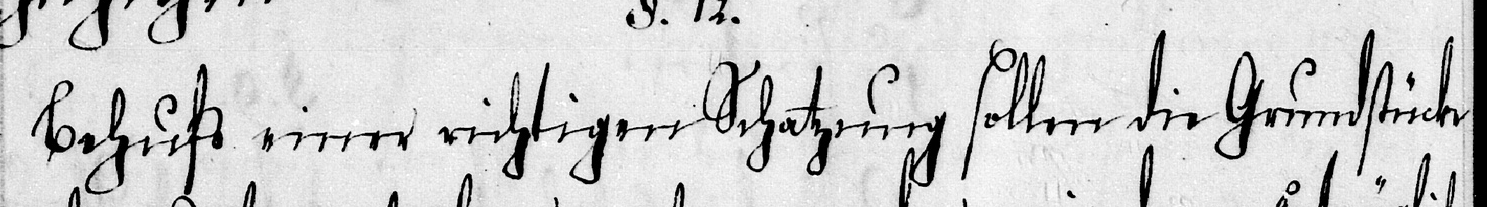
Behufs einer richtigen Schatzung sollen die Grundstücke
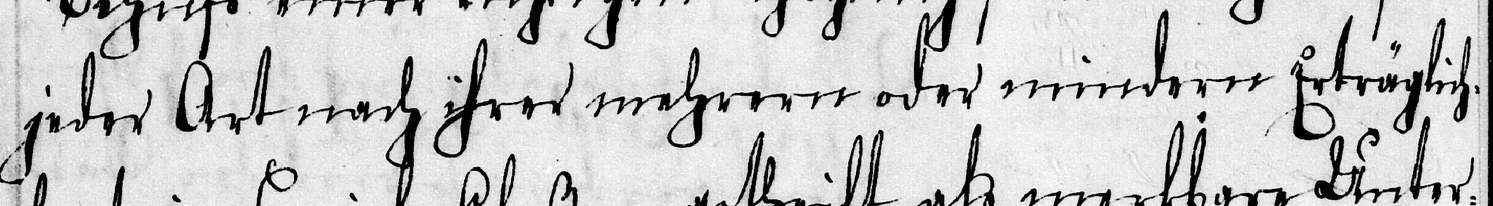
jeder Art nach ihrer mehrern oder mindern Erträglic¬
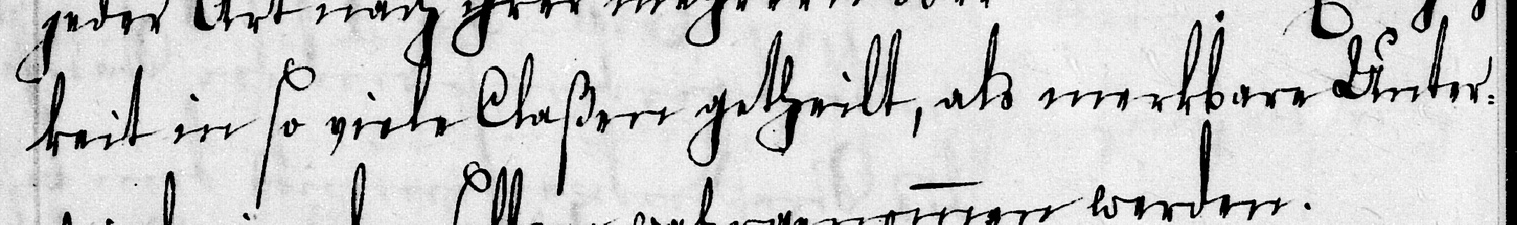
hkeit in so viele Claßen getheilt, als merkbare Unter¬
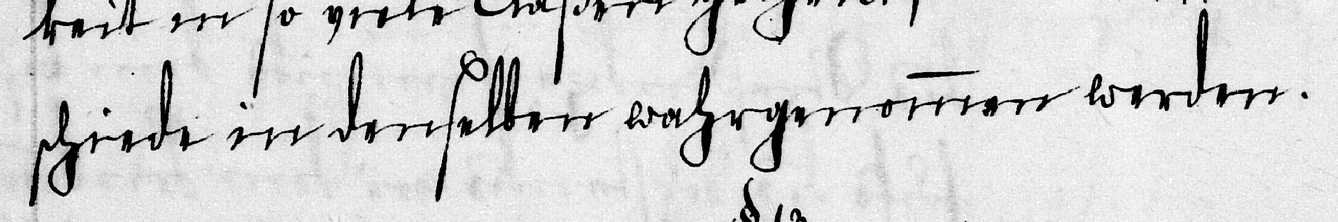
schiede in denselben wahrgenommen werden.
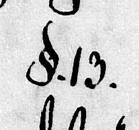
§. 13.
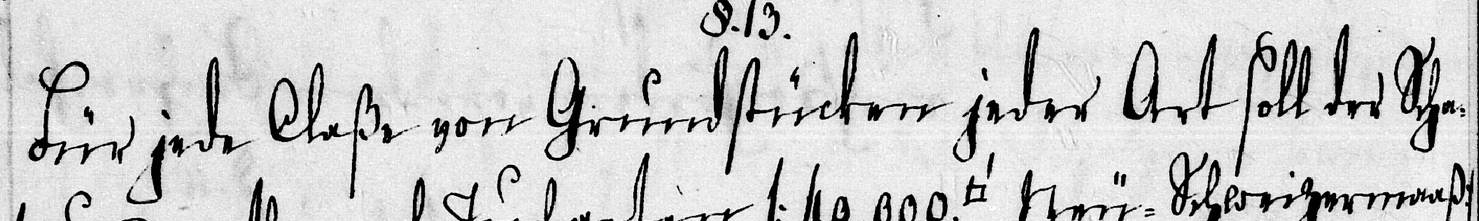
Für jede Claße von Grundstücken jeder Art soll der S¬
